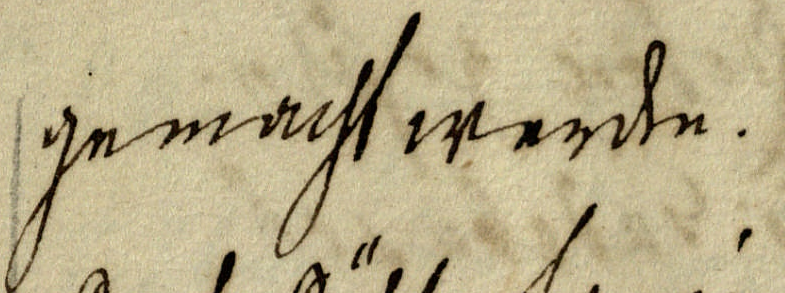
gemacht werden.
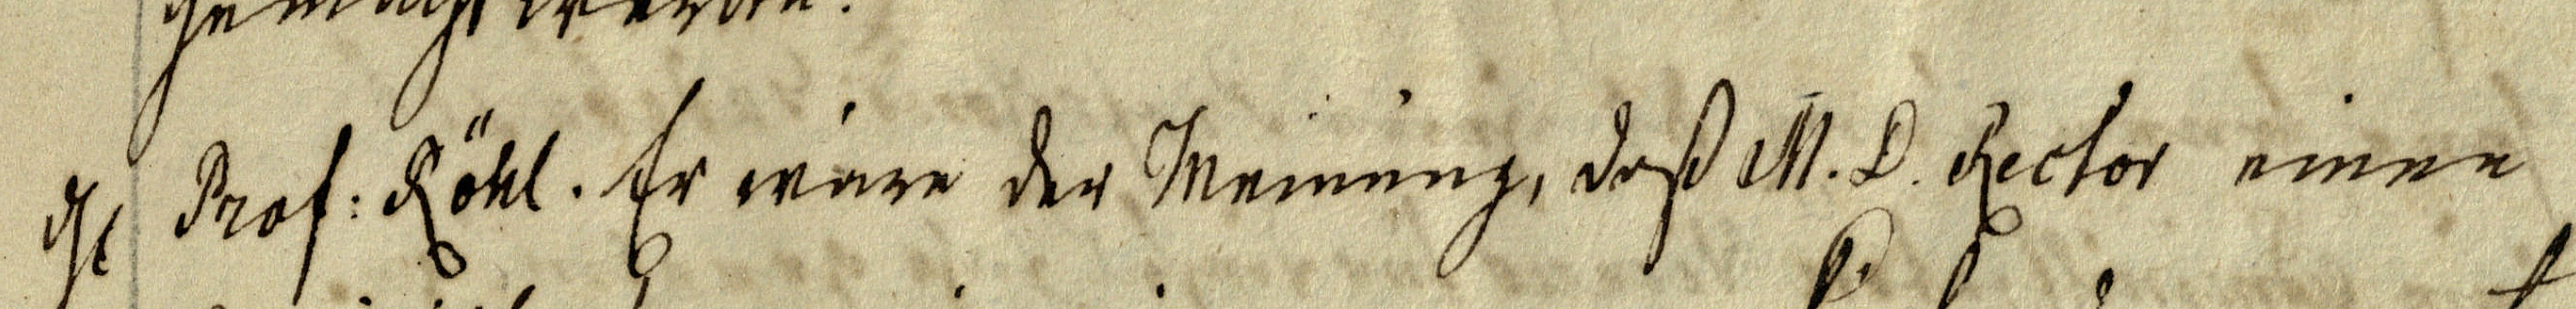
dh Prof: Röhl. Er wäre der Meinung, daß M. D. Rector einen
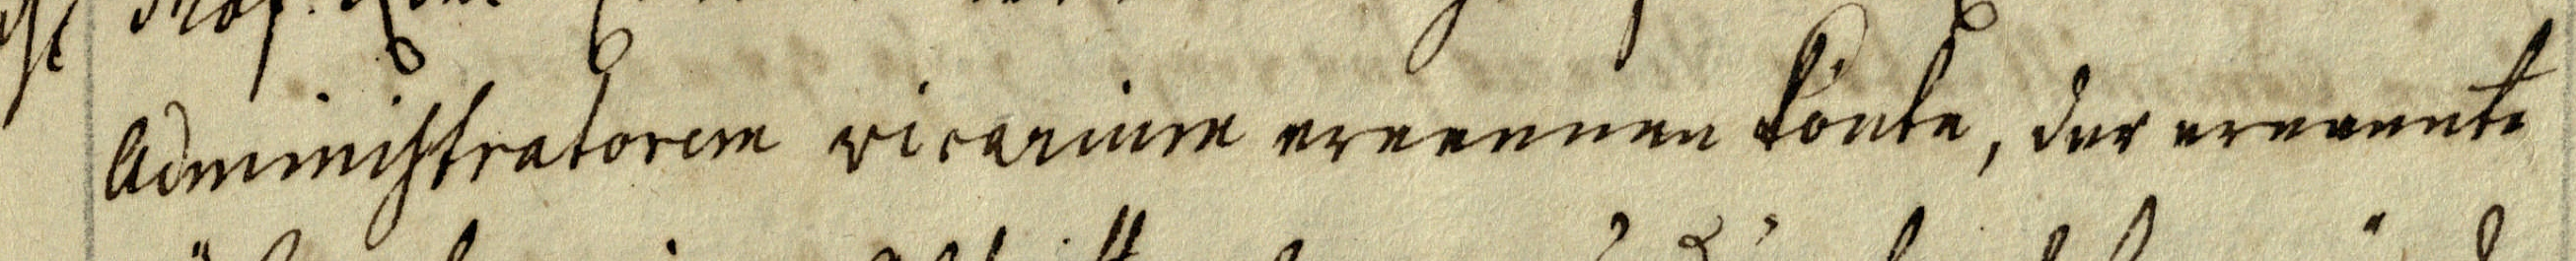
Administratorem vicarium ernennen könte, der ernannte
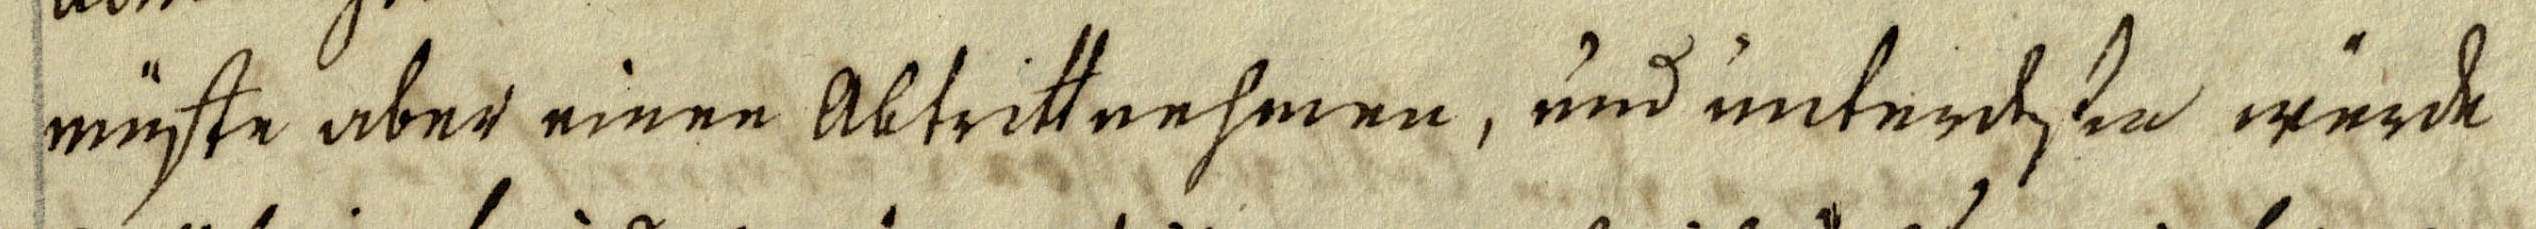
müßte aber einen Abtritt nehmen, und unterdeßen würde
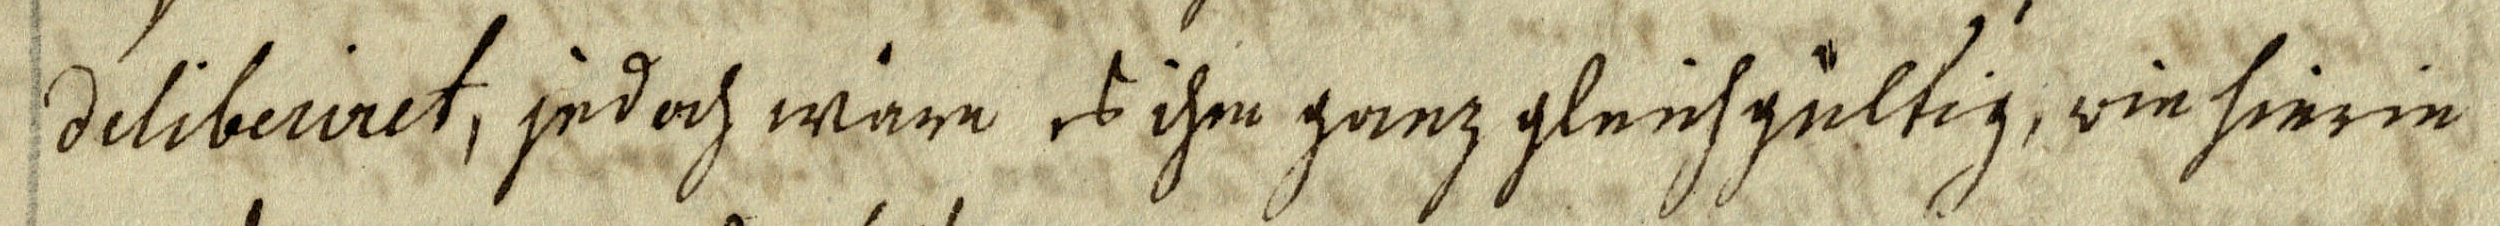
deliberiret, jedoch wäre es ihm ganz gleichgültig, wie hierin
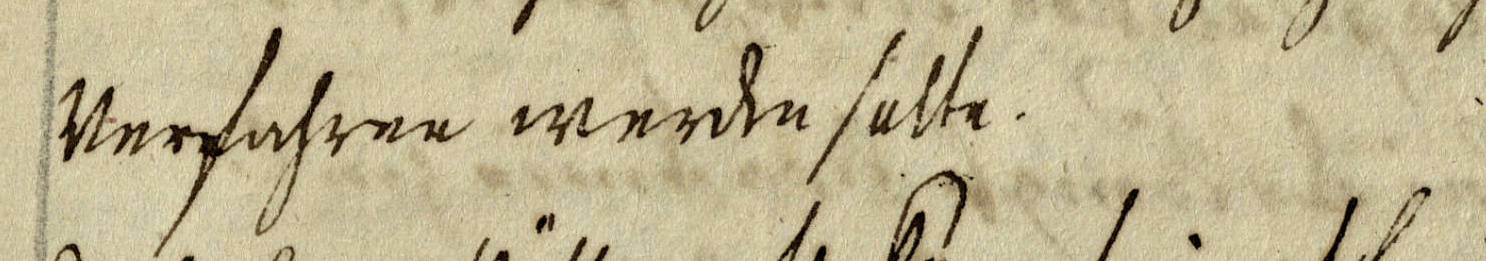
verfahren werden solte.
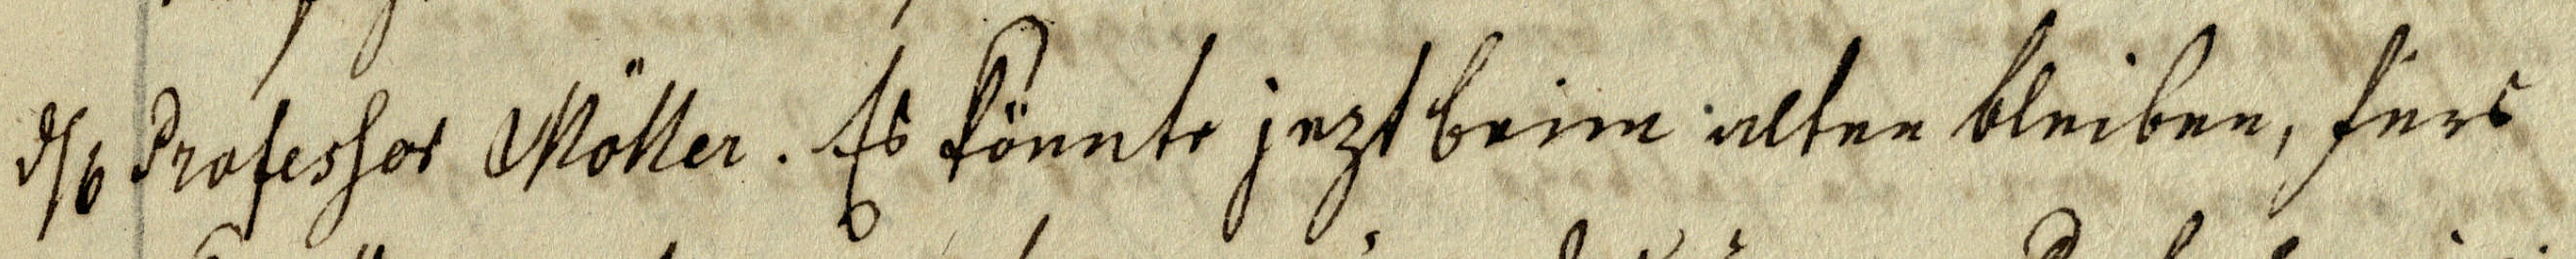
dh Professor Möller. Es könnte jezt beim alten bleiben, fürs
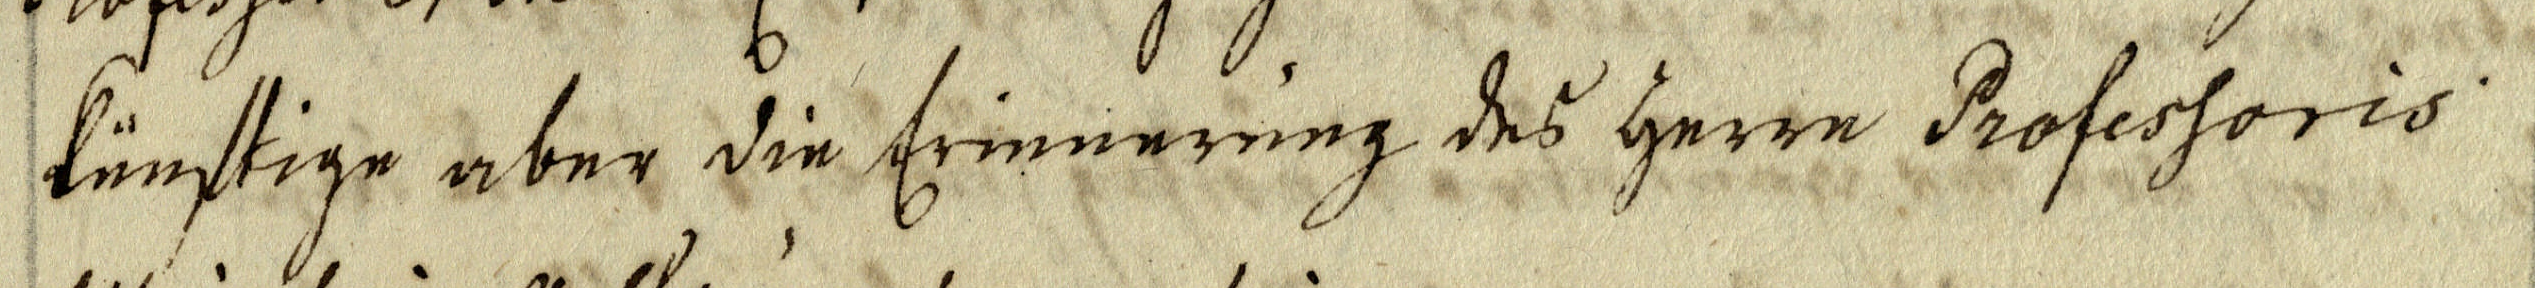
künftige aber die Erinnerung des Herrn Professoris
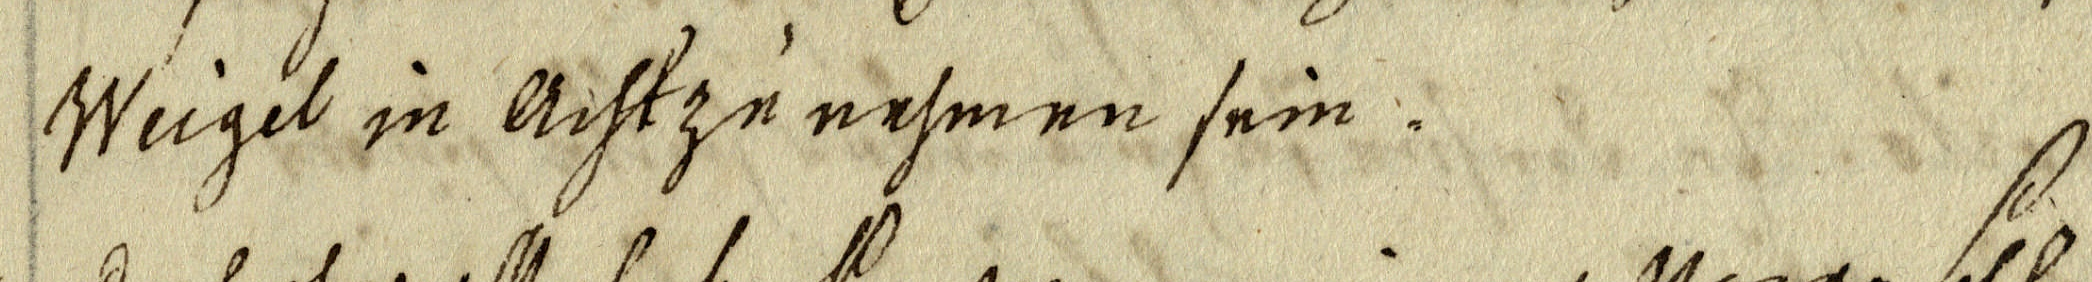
Weigel in Acht zu nehmen sein.
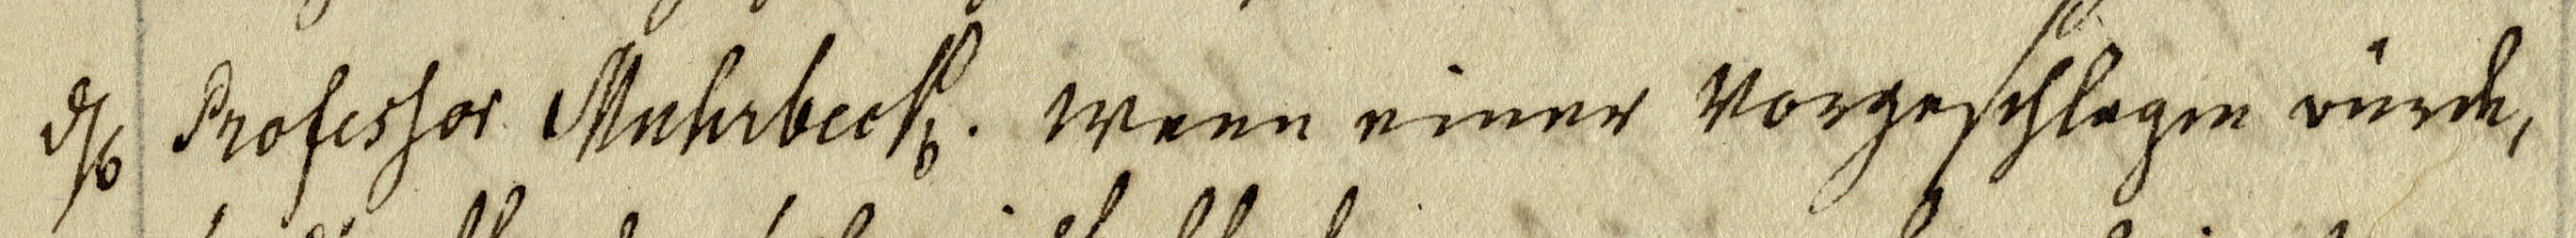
dh Professor Muhrbeck. wenn einer vorgeschlagenwürde,
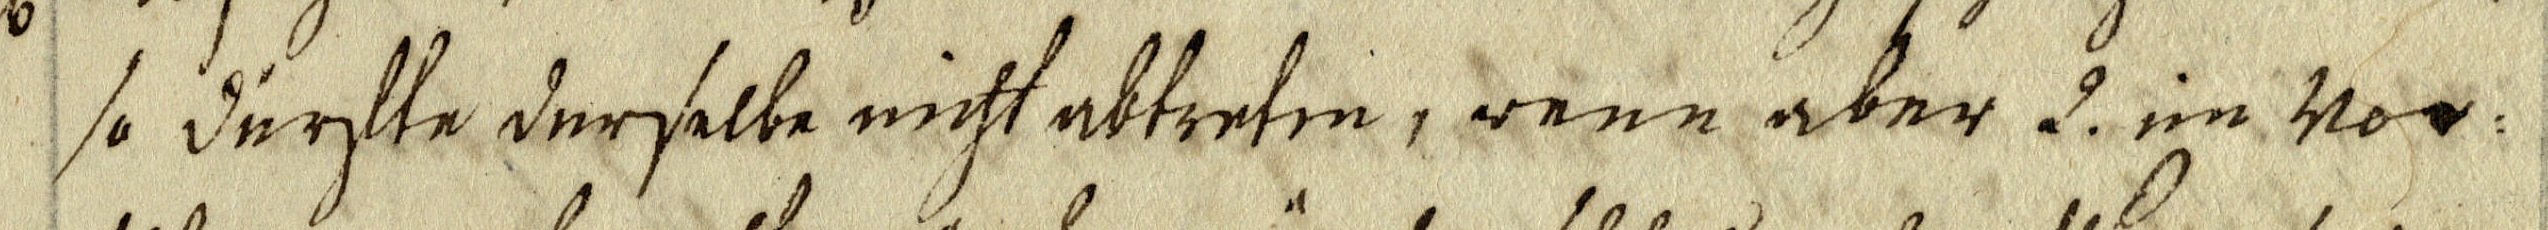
so dürfte derselbe nicht abtreten, wenn aber 2. im Vor¬
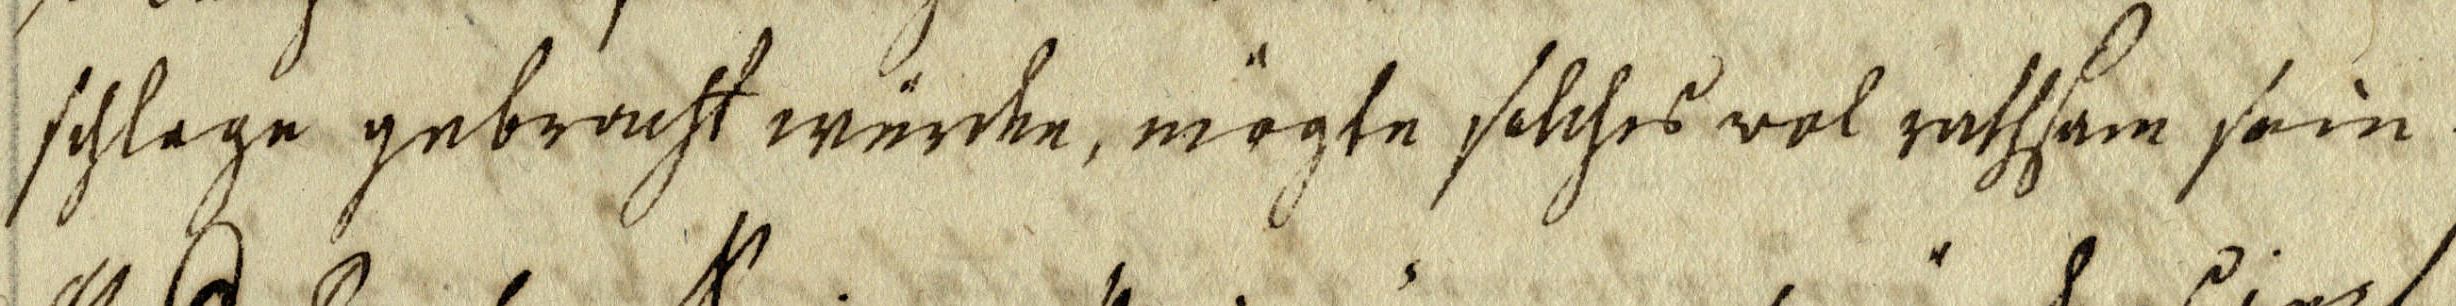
schlage gebracht würden, mögte solches wol rathsam sein.
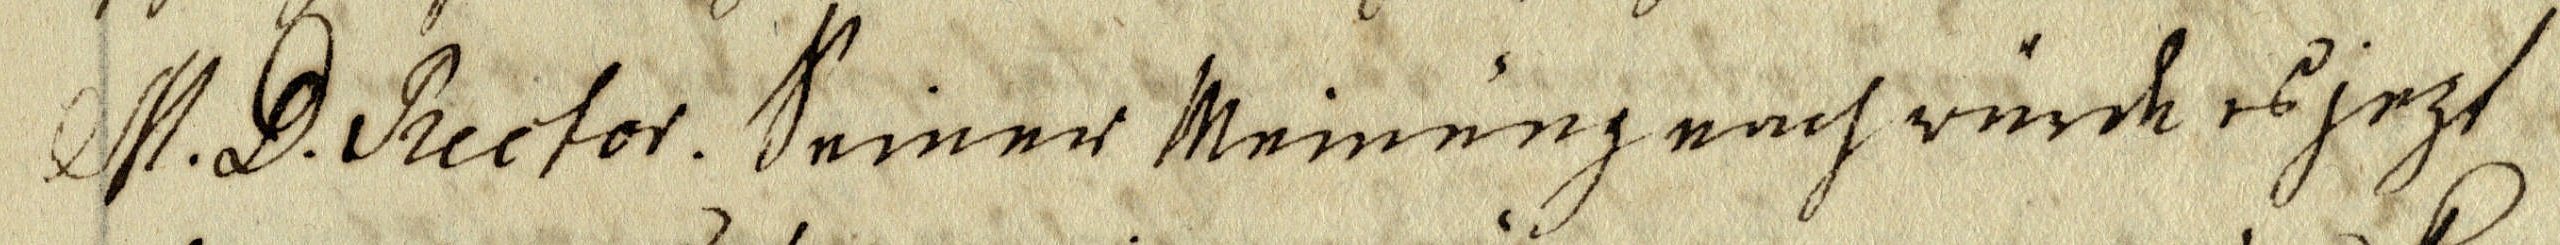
M. D. Rector. Seiner Meinung nach würde es jezt
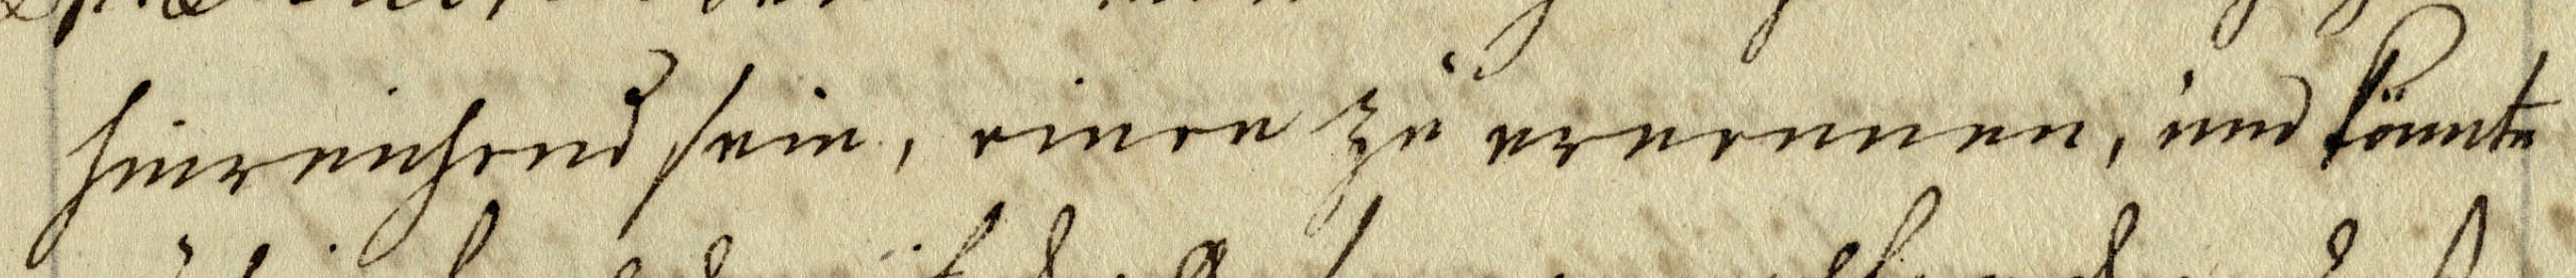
hinreichend sein, einen zu ernennen, und könnte
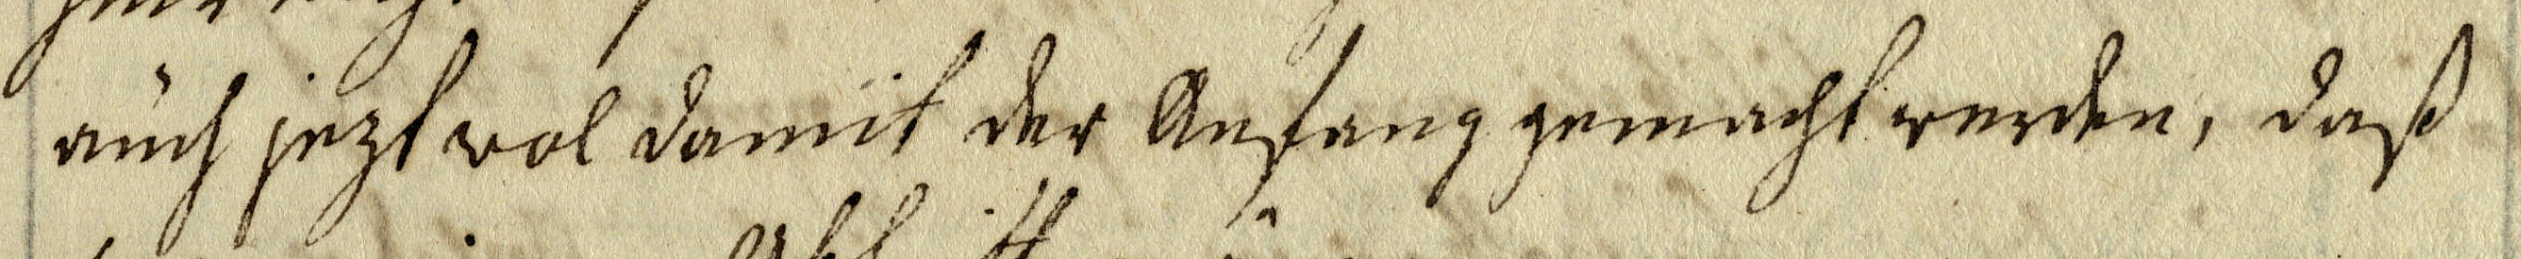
auch jezt wol damit der Anfang gemacht werden, daß
